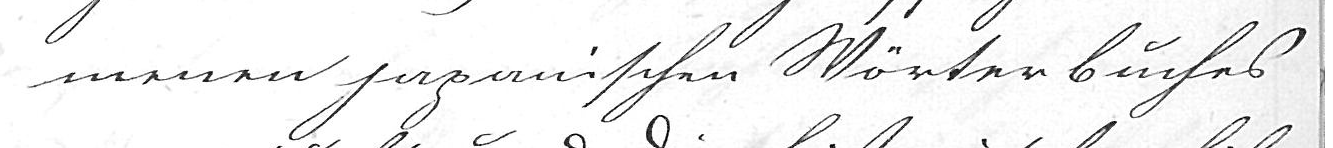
menen japanischen Wörterbuches
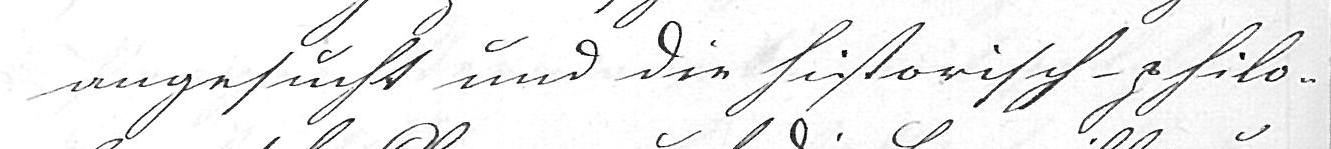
angesucht und die historisch-philo-
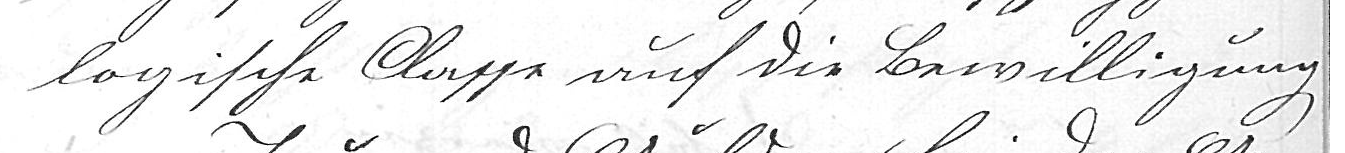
logische Classe auf die Bewilligung
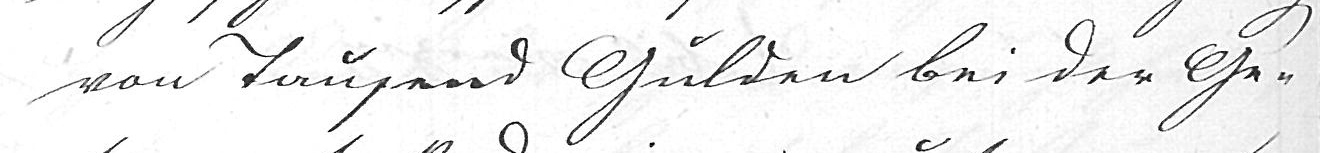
von Tausend Gulden bei der Ge-
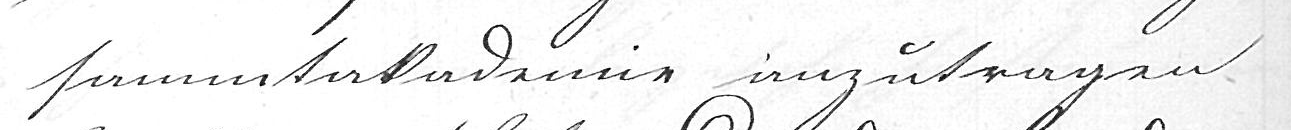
sammtakademie anzutragen
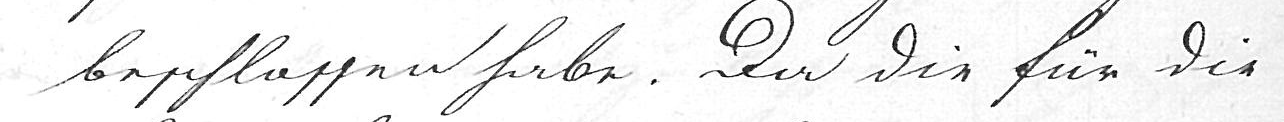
beschlossen habe. Da die für die
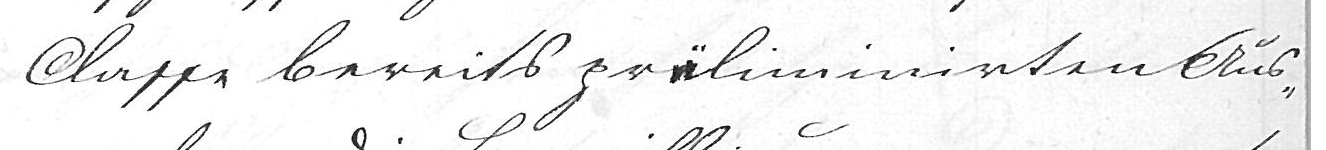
Classe bereits präliminirten Aus-
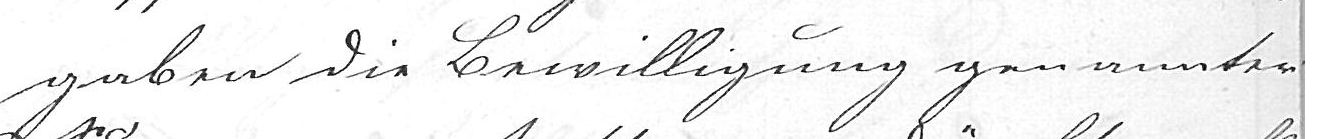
gaben die Bewilligung genannter
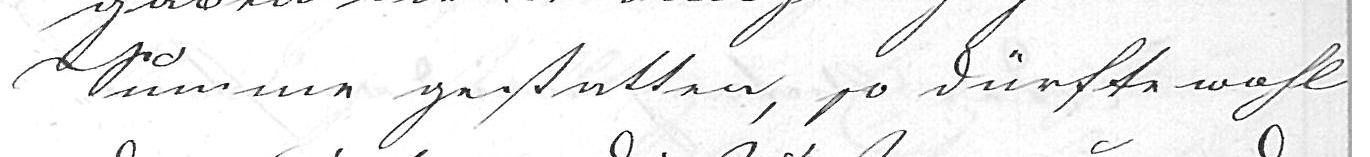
Summe gestatten, so dürfte wohl
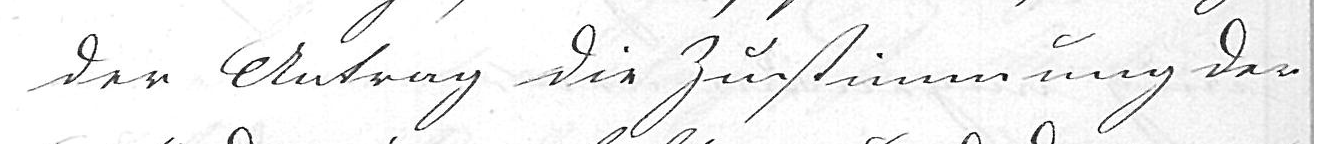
der Antrag die Zustimmung der
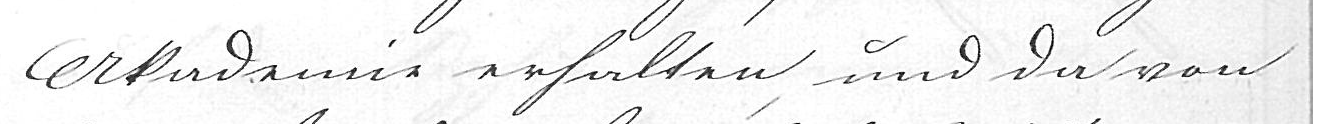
Akademie erhalten und da von
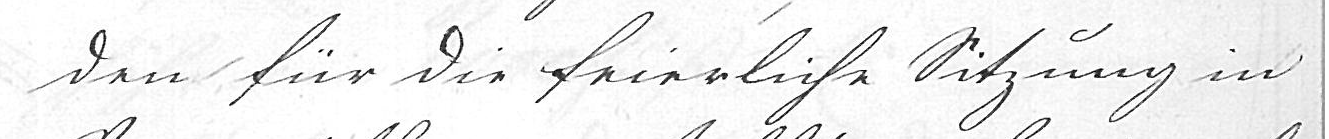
den für die feierliche Sitzung in
